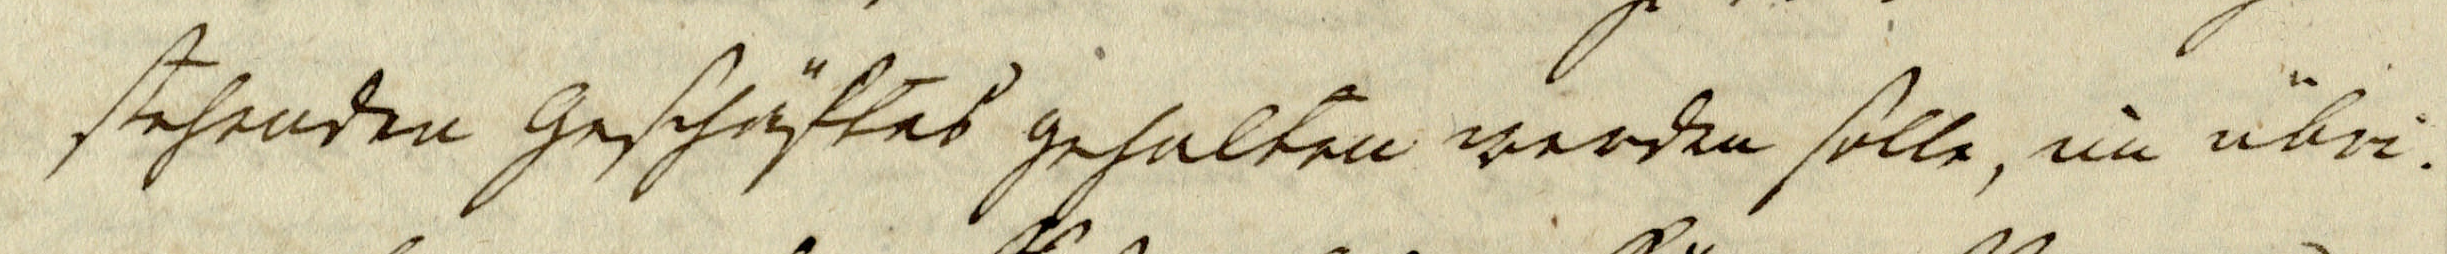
stehenden Geschäftes gehalten werden solle, im übri¬
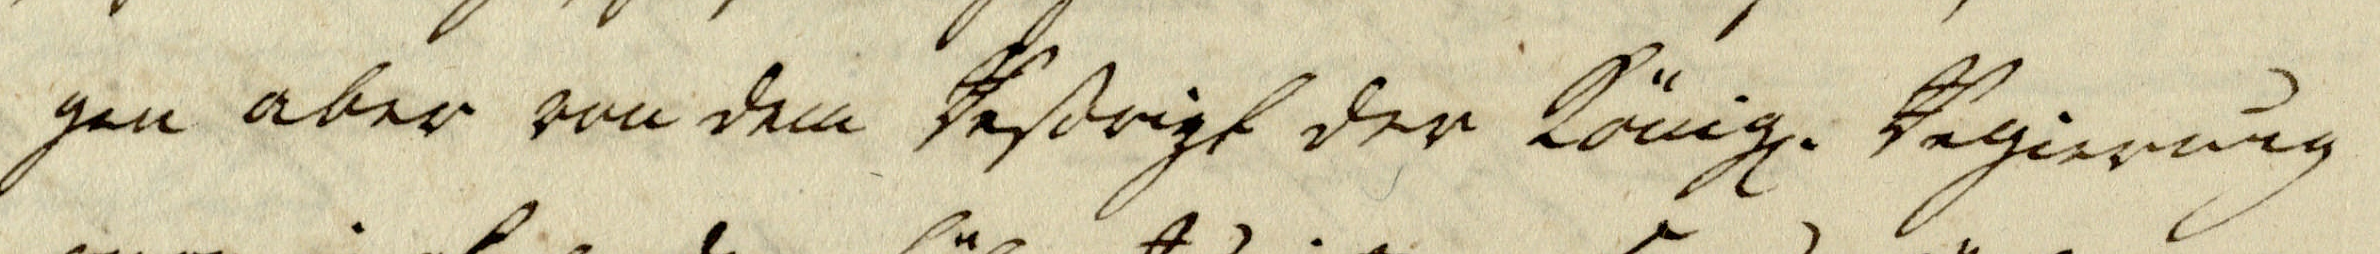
gen aber von dem Rescript der Königl. Regierung
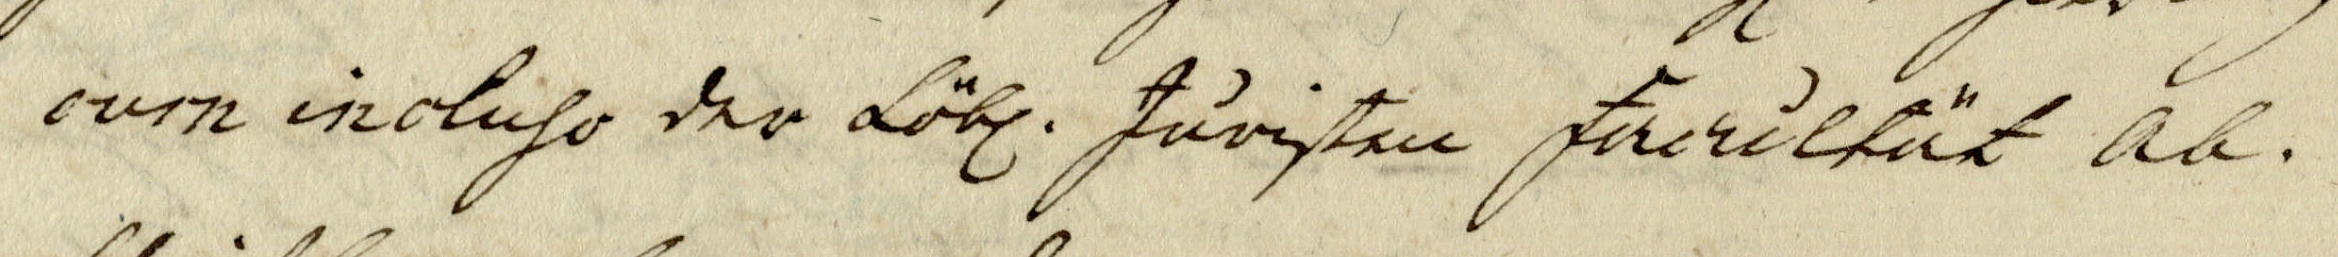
cum incluso der Löbl. Juristen Facultät Ab¬
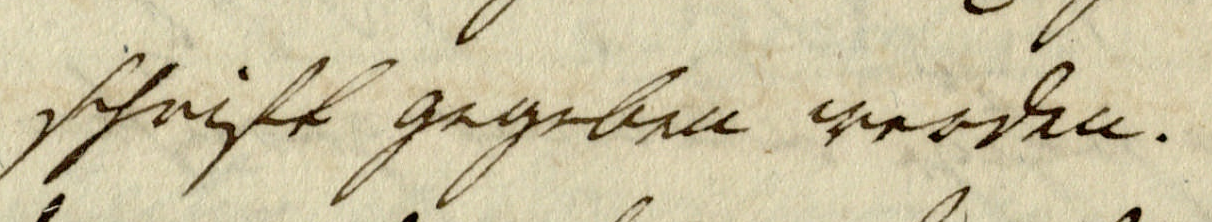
schrift gegeben werden.
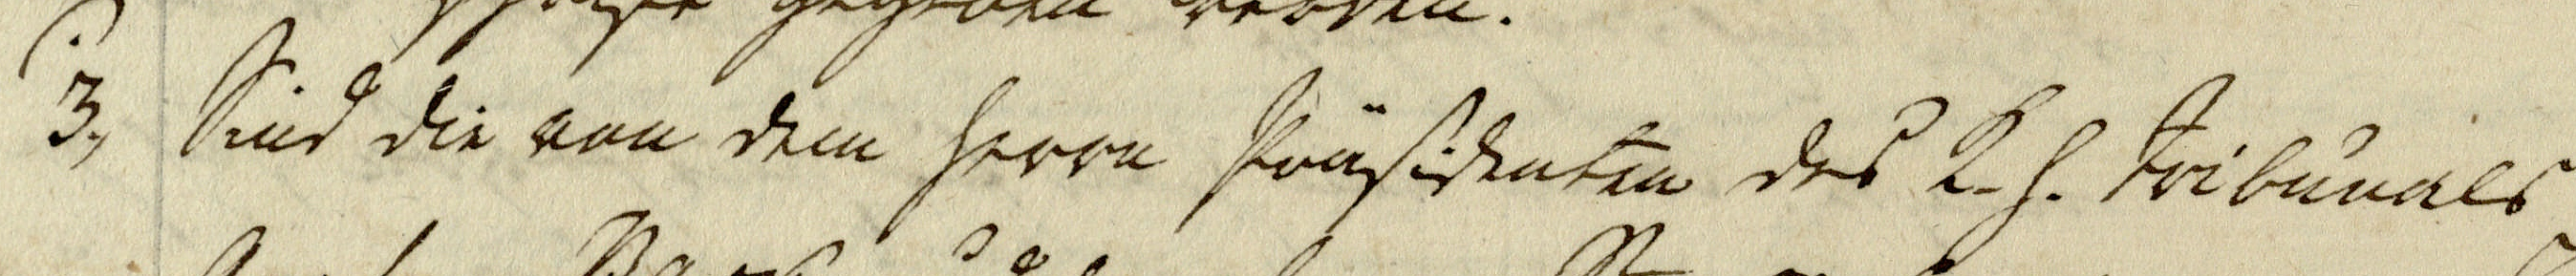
3., Sind die von dem Herrn Präsidenten des K. H. Tribunals
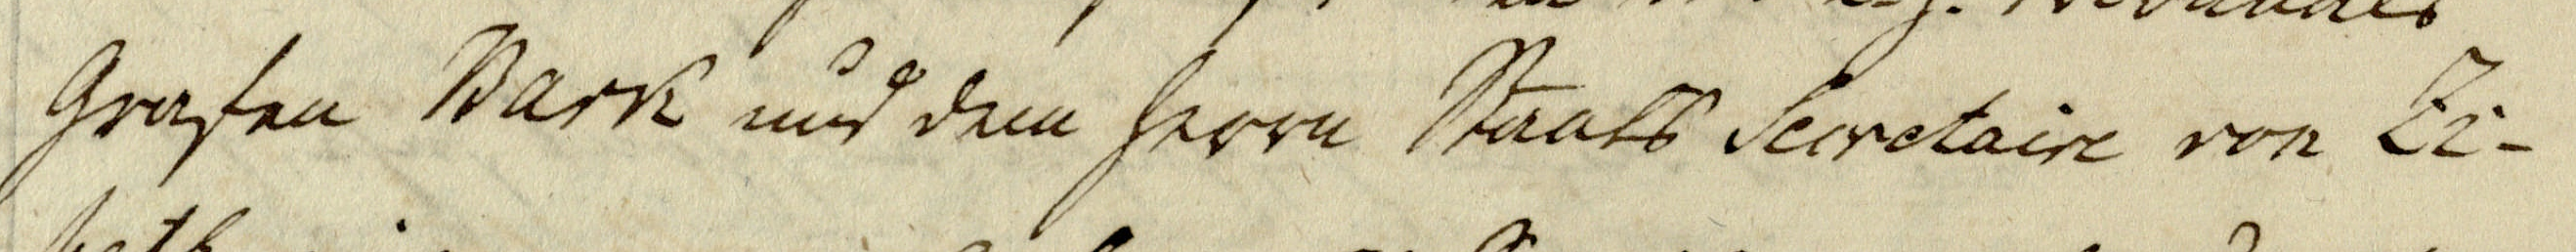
Grafen Bark und dem Herrn Staats Secretaire von Zi¬
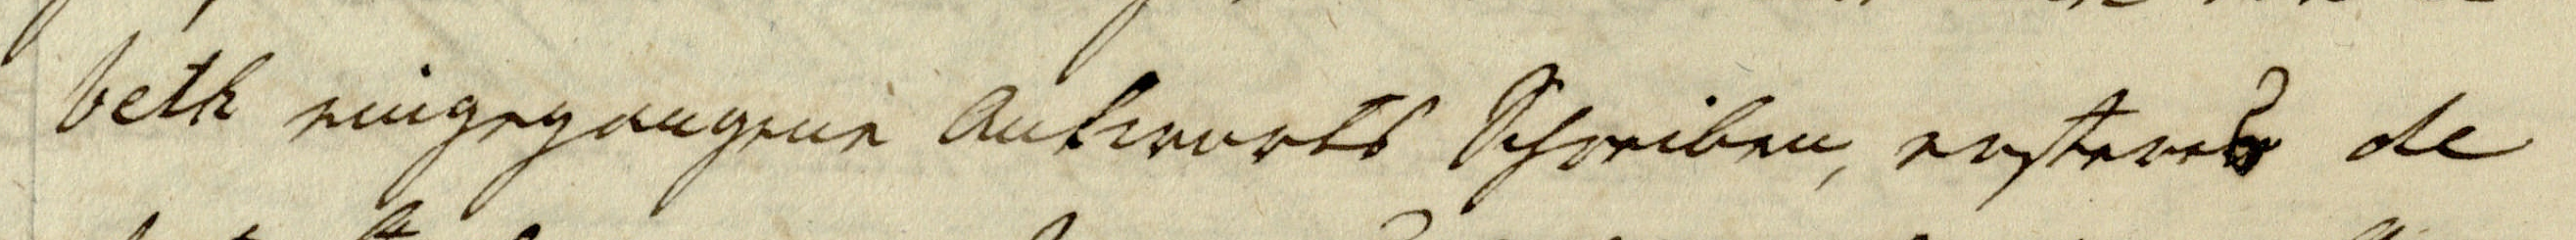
beth eingegangene Antworts Schreiben, ersteres de
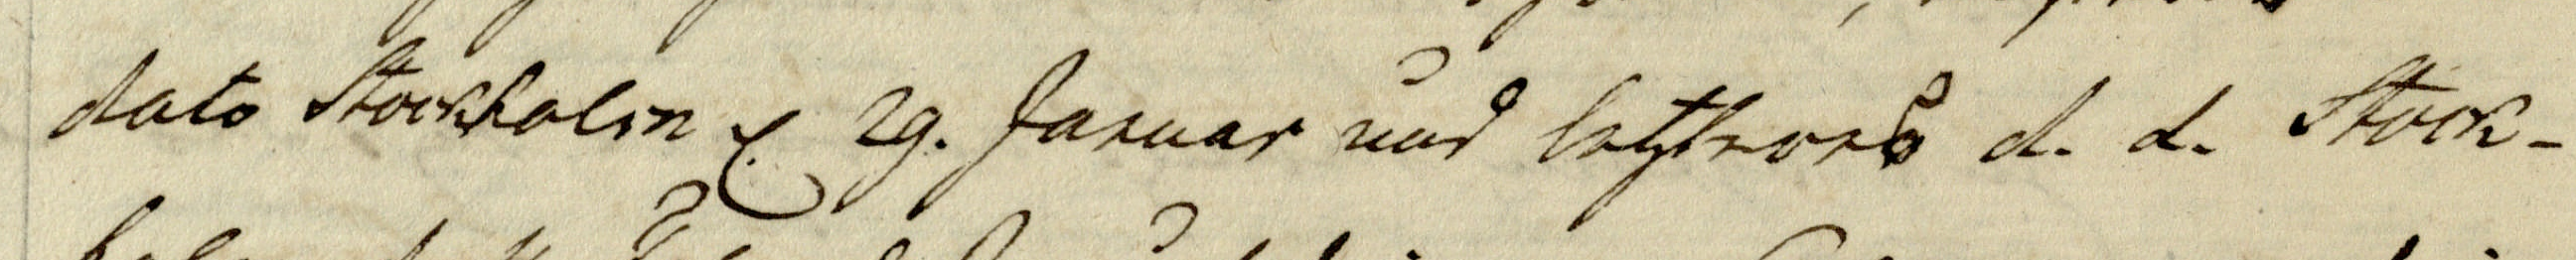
dato Stockholm d. 29. Januar und letzteres d. d. Stock¬
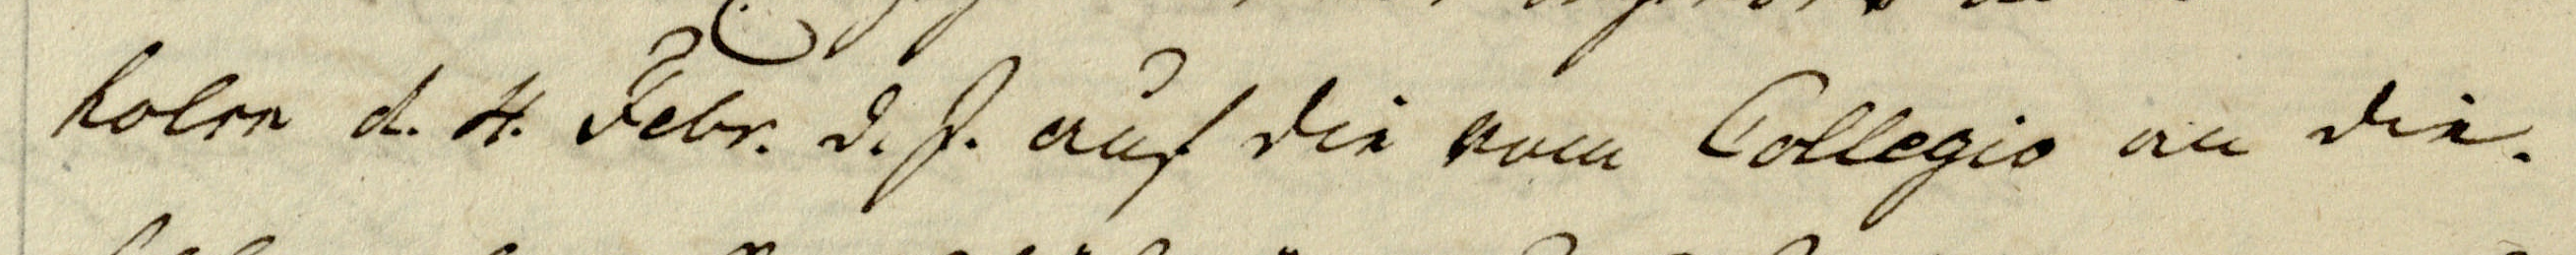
kolm d. 4. Febr. d. J. auf die vom Collegio an die¬
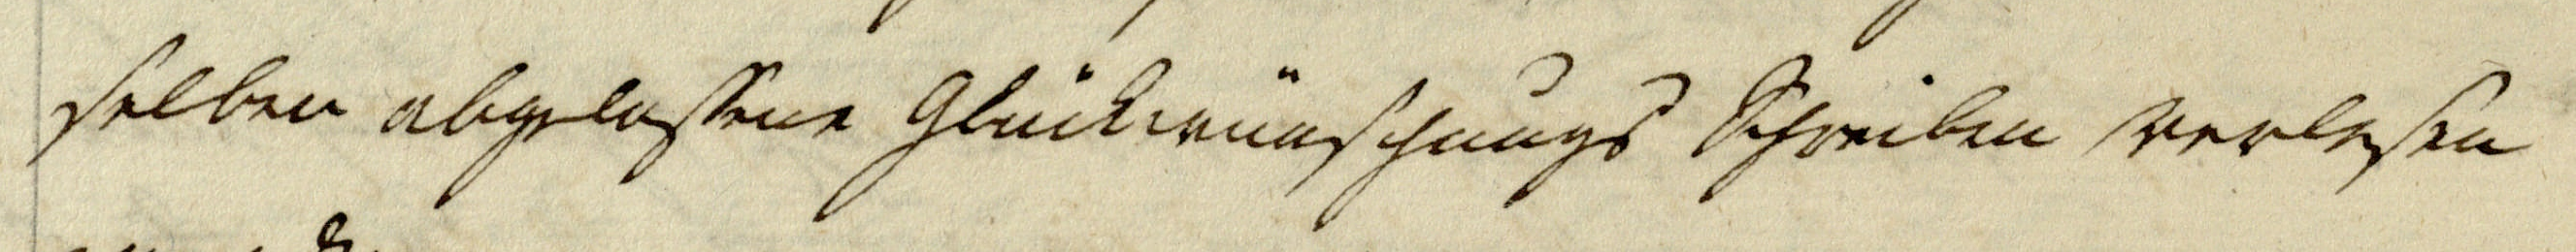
selben abgelassene Glückwünschungs Schreiben verlesen
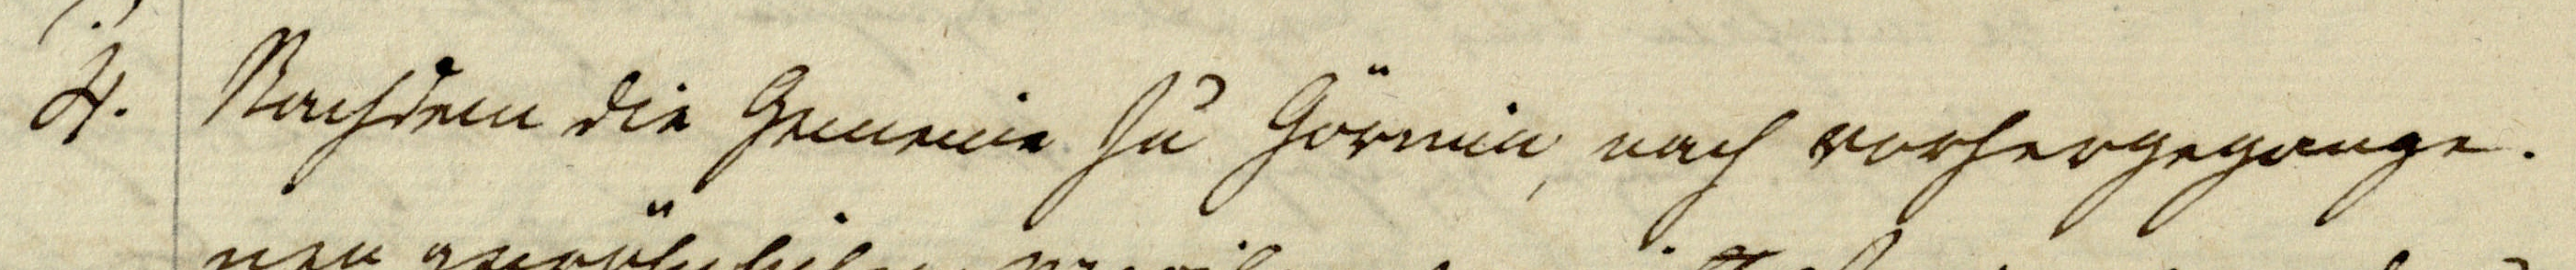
4. Nachdem die Gemeine zu Göormnin nach vorhergegange¬
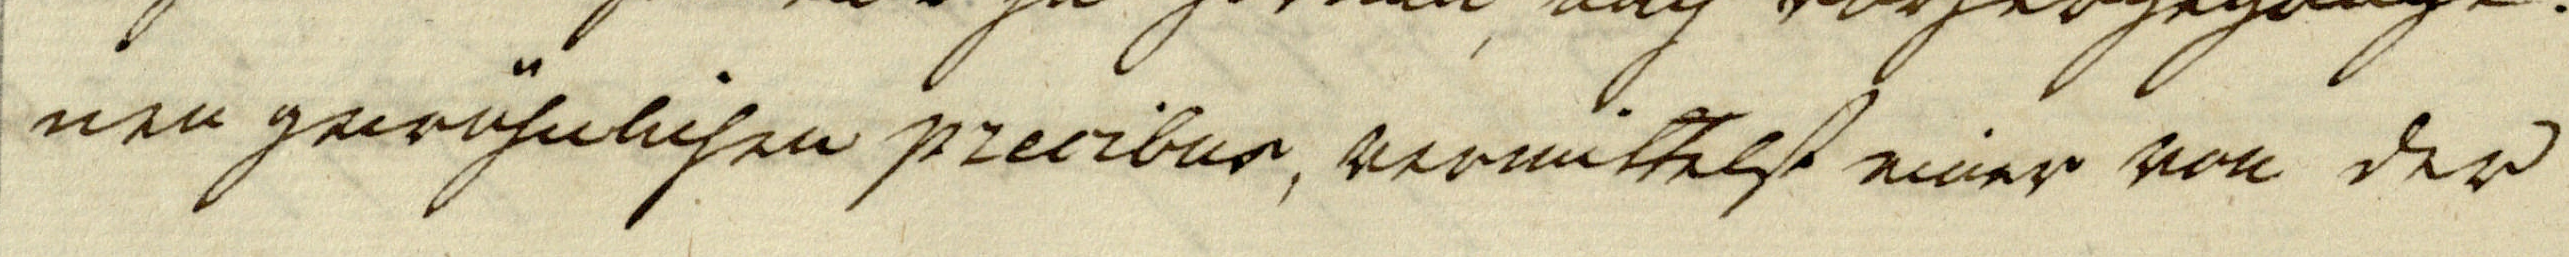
nen gewöhnlichen precibus, vermittelst einer von der
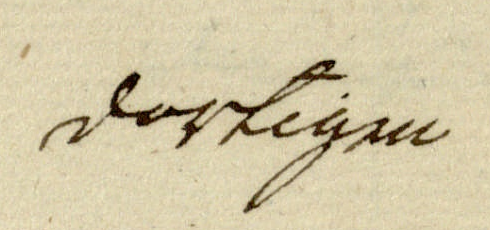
dortigen
